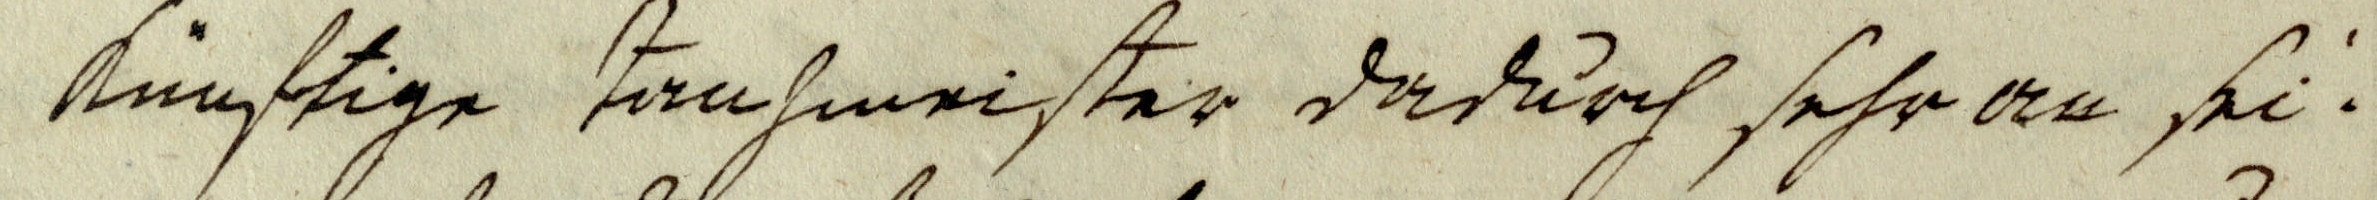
künftige Tanzmeister dadurch sehr an sei¬
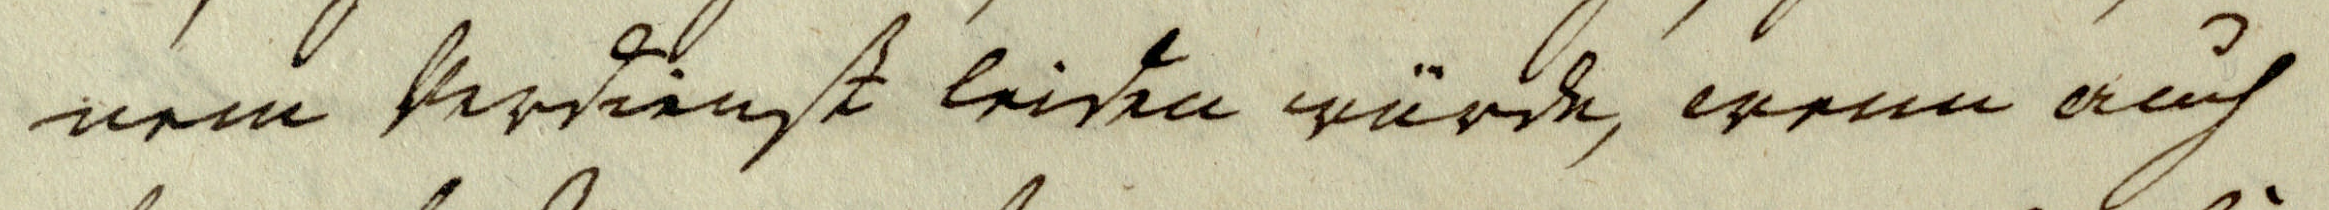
nem Verdienst leiden würde, wenn auch
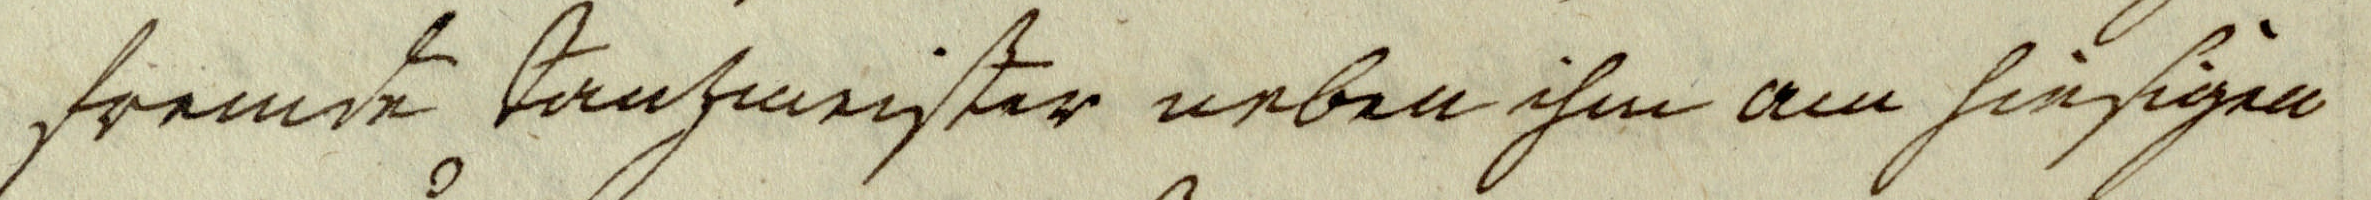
fremde Tanzmeister neben ihm am hiesigen
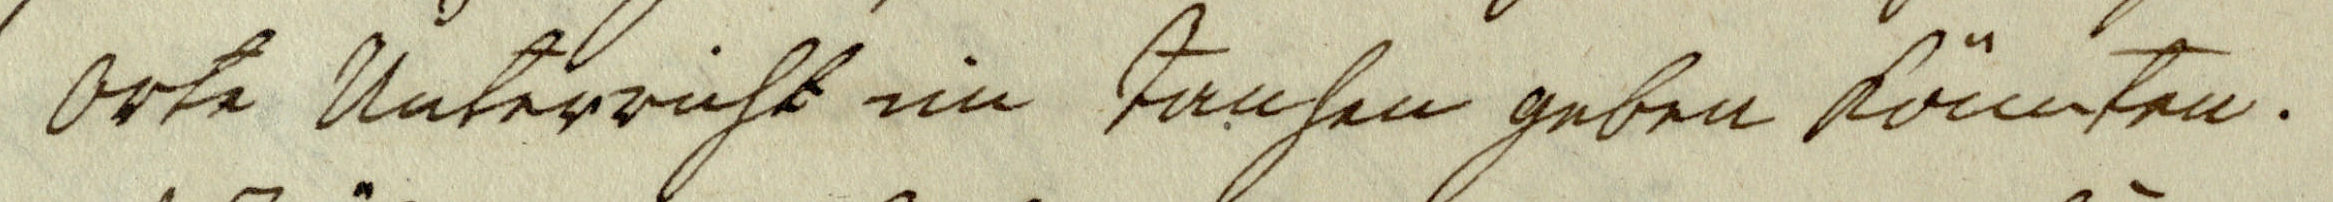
Orte Unterricht im Tanzen geben könnten.
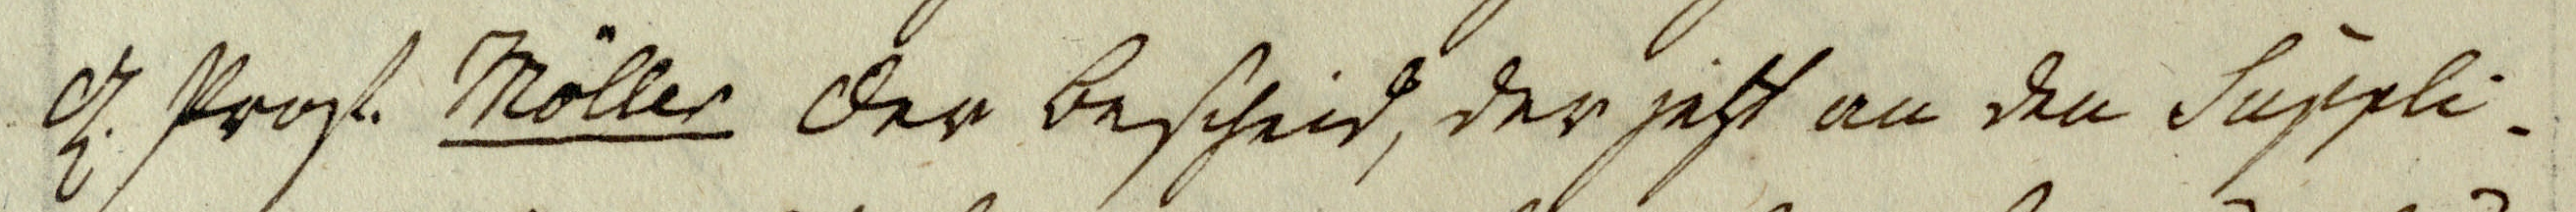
dh. Prof. Möller Der Bescheid, der jetzt an den Suppli¬
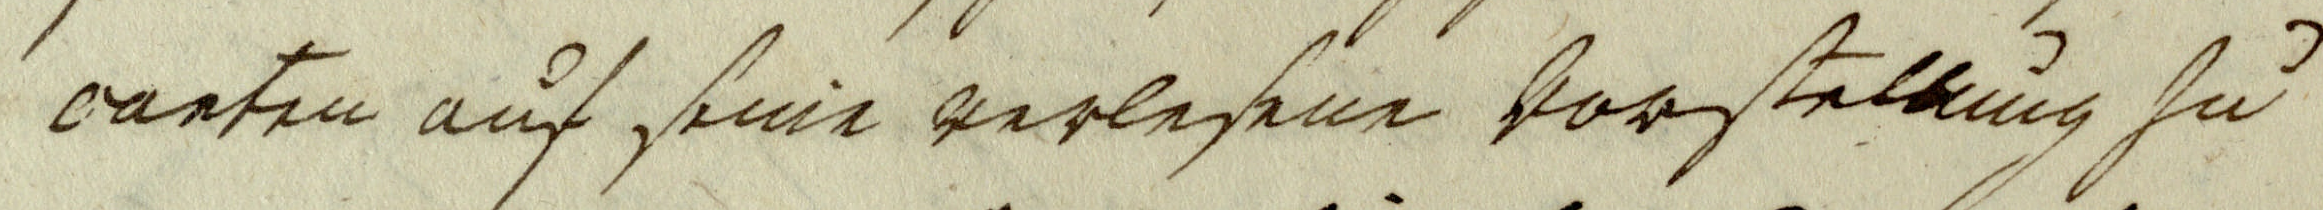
canten auf seine verlesene Vorstellung zu
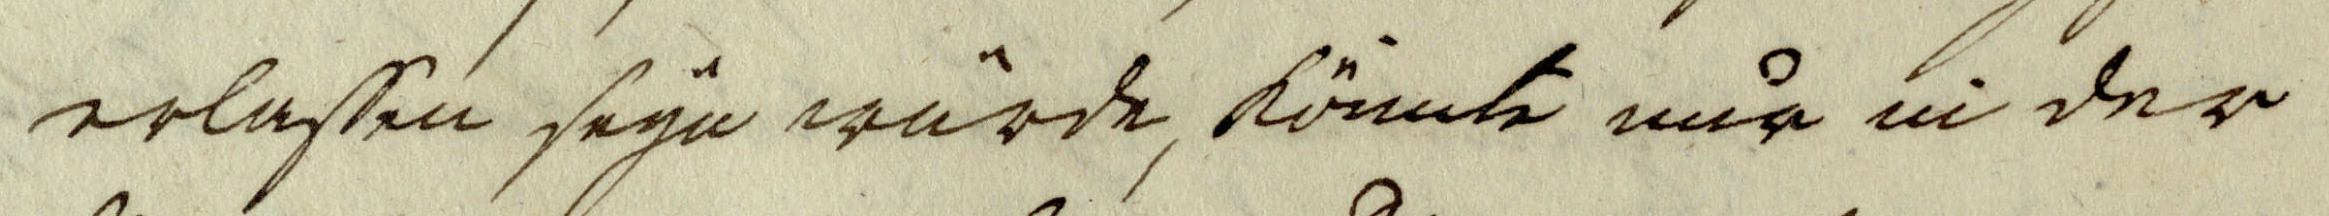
erlassen seÿn würde, könnte nur in der
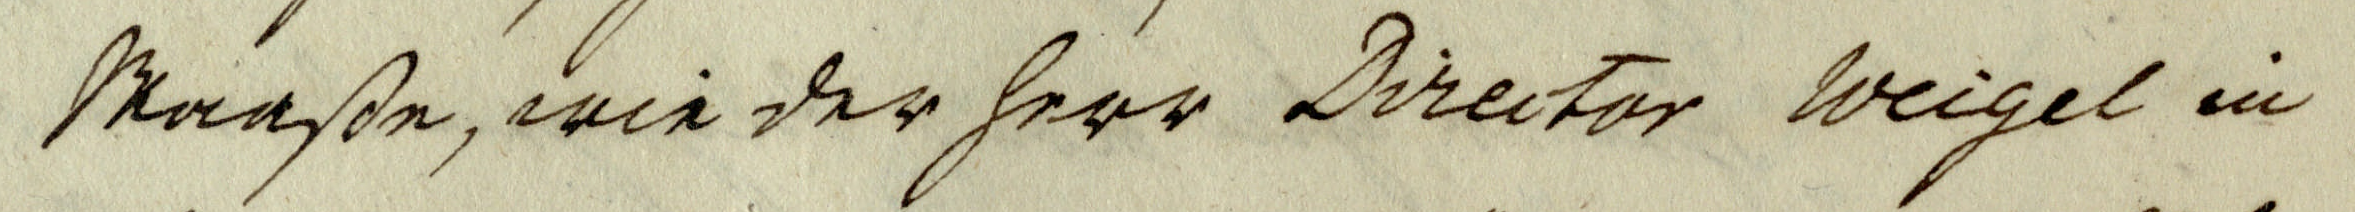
Maaße, wie der Herr Director Weigel in
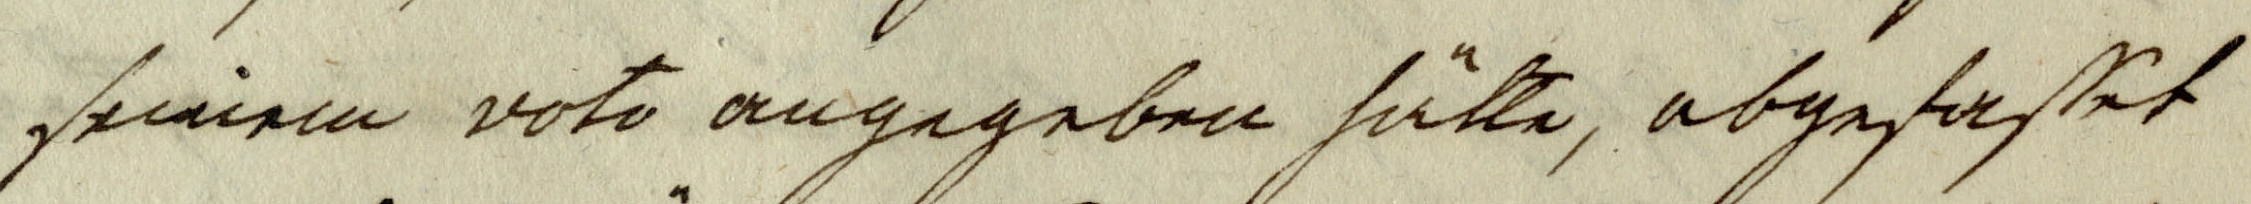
seinem voto angegeben hätte, abgestattet
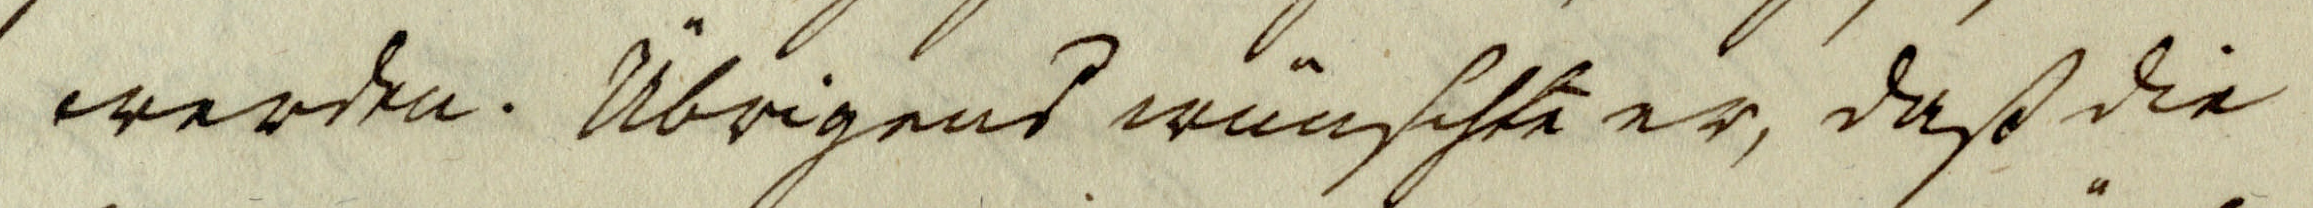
werden. Übrigens wünschte er, daß die
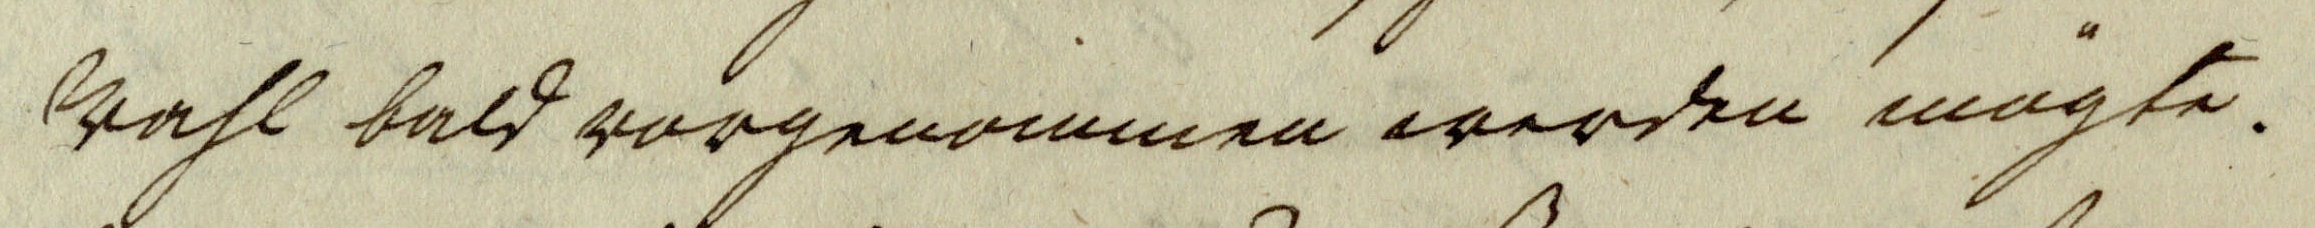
Wahl bald vorgenommen werden mögte.
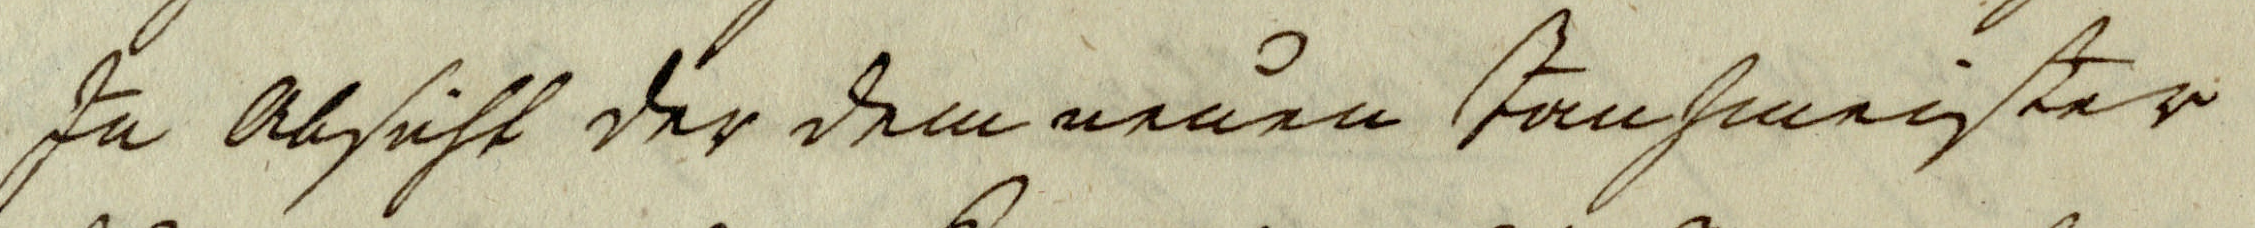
In Absicht der dem neuen Tanzmeister
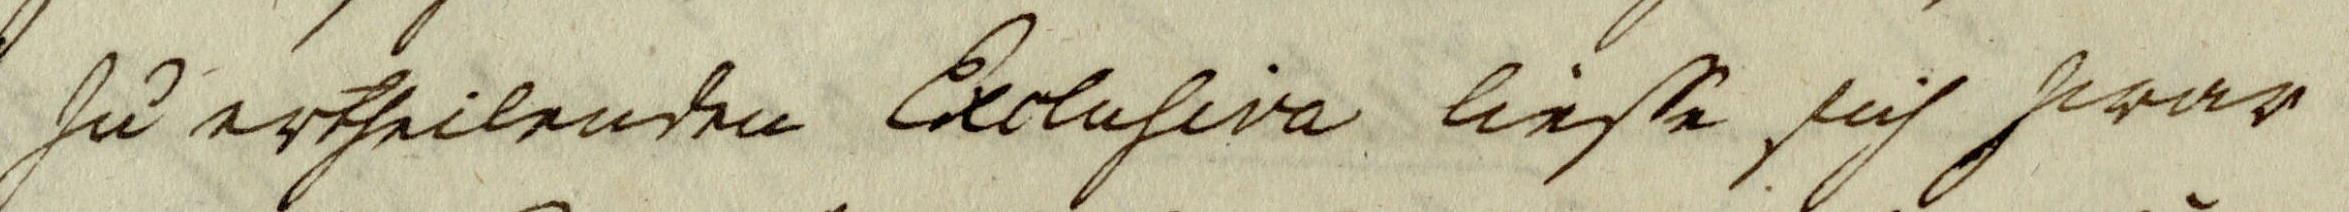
zu ertheilenden Exclusiva liesse sich zwar
